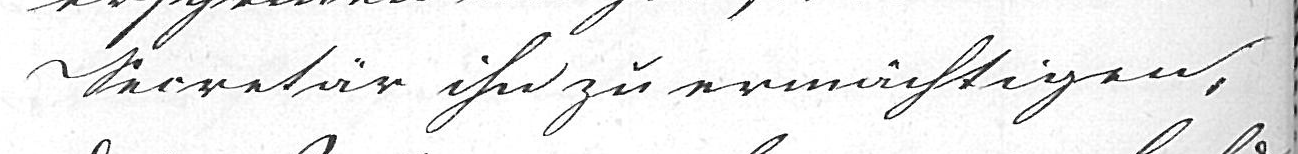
Secretär ihn zu ermächtigen,
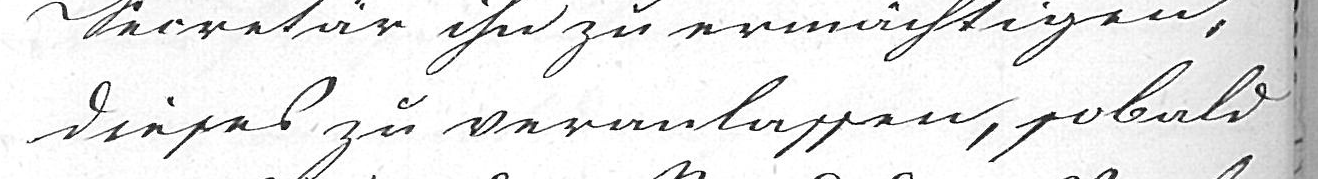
dieses zu veranlassen, sobald
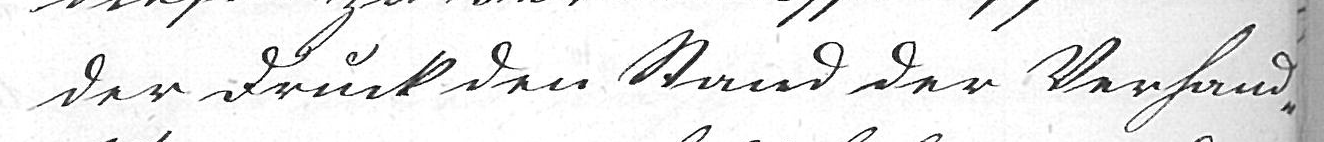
der Druck den Stand der Verhand-
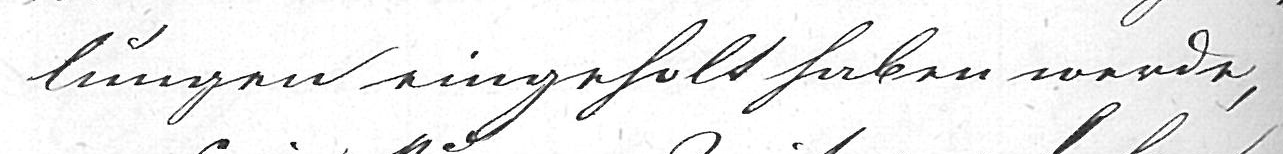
lungen eingeholt haben werde,
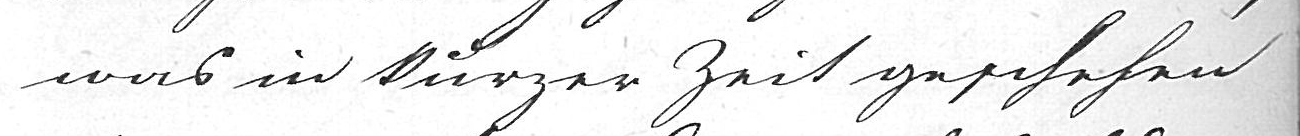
was in kurzer Zeit geschehen
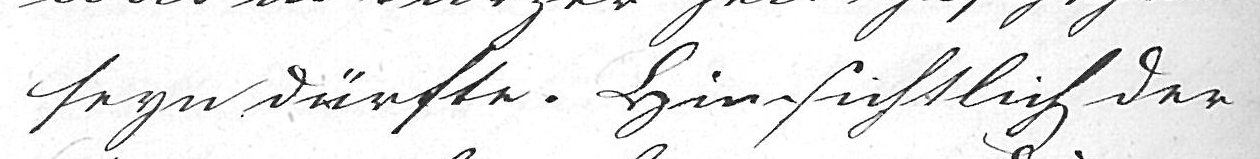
seyn dürfte. Hinsichtlich der
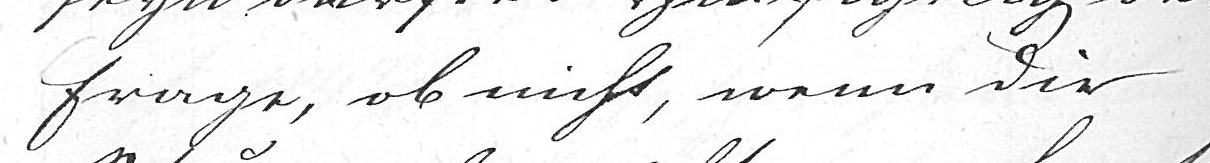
Frage, ob nicht, wenn die
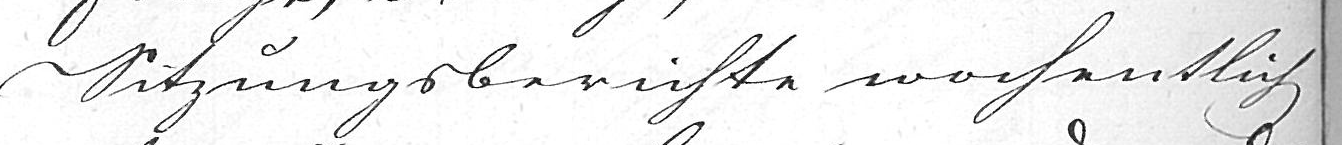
Sitzungsberichte wochentlich
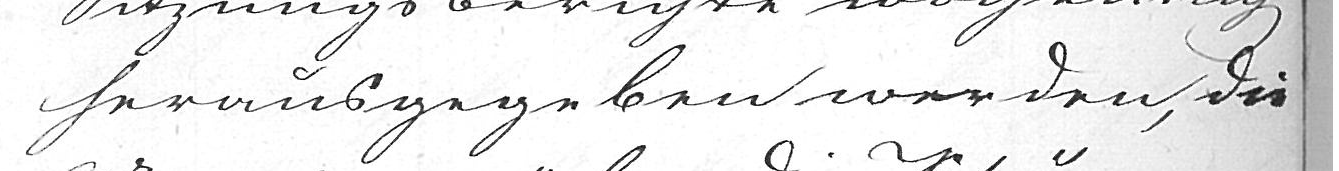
herausgegebenen werden, die
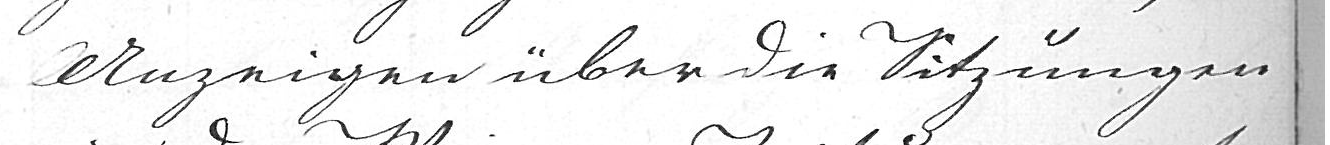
Anzeigen über die Sitzungen-
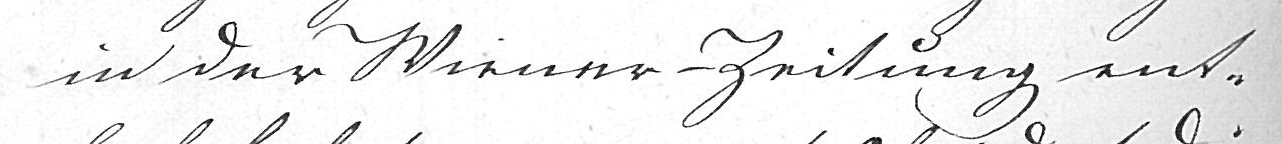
in der Wiener Zeitung ent-
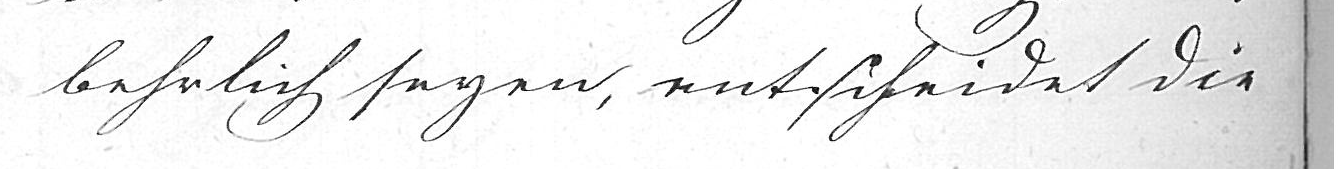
behrlich seyen, entscheidet die
